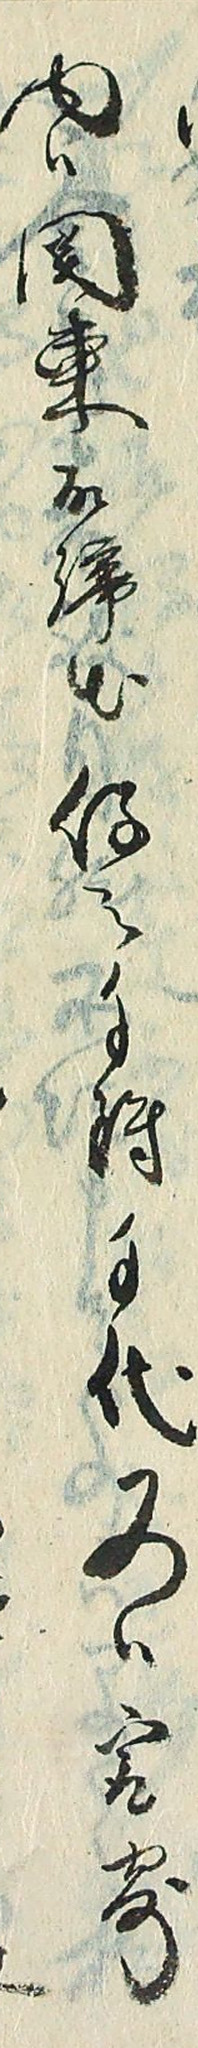内は関東取締出役之手附手代又は最寄
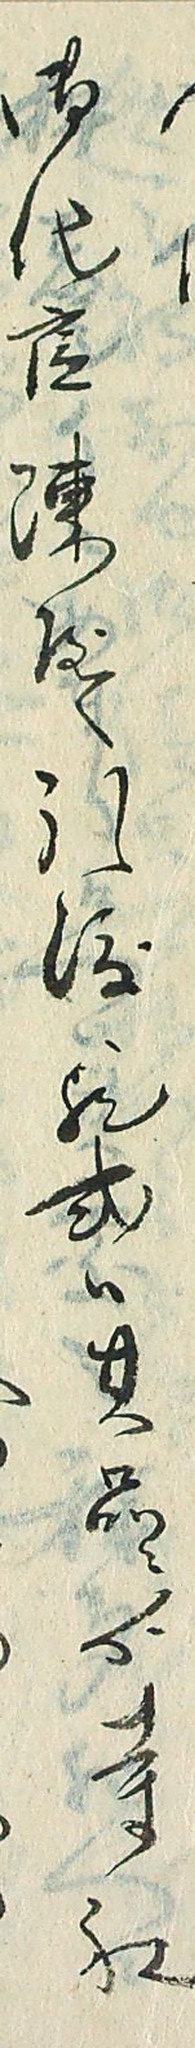御代官陣屋へ引渡候歟或は其品にゟ寺社
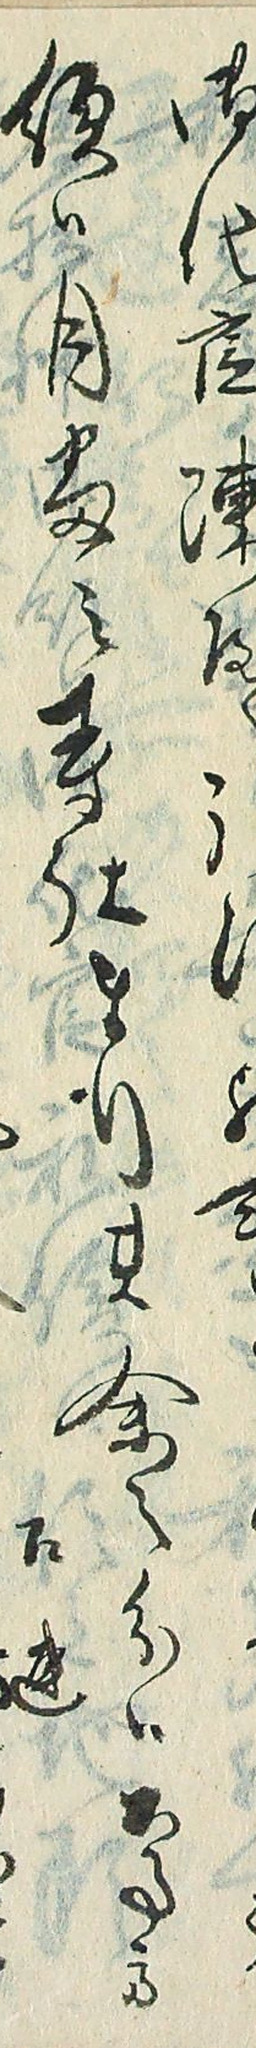領は月番之寺社奉行其余之分は公事方
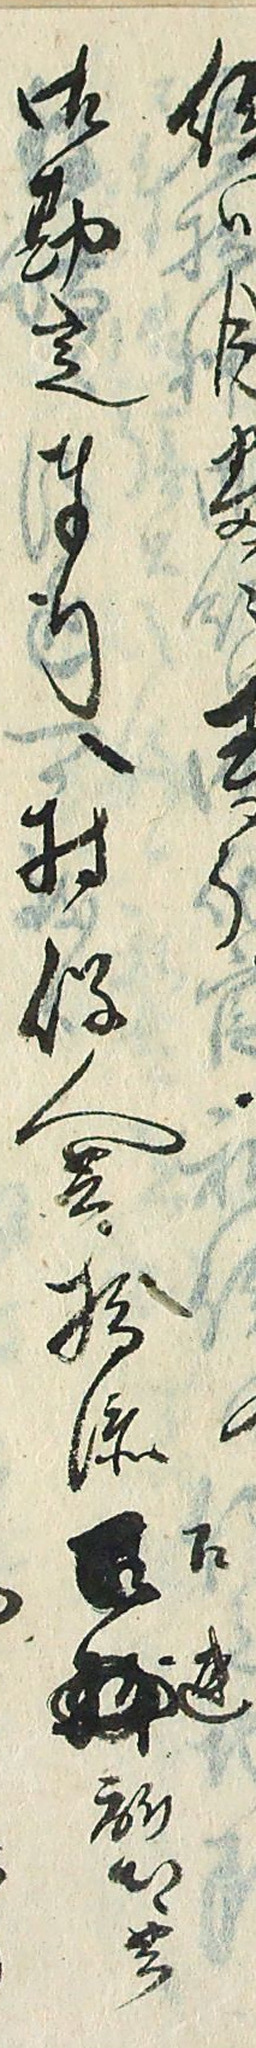御勘定奉行へ村役人共指添召連訴出候共
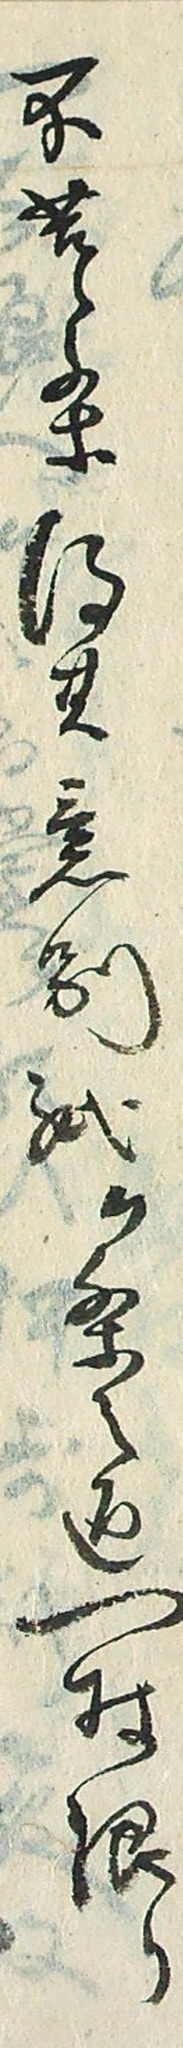不苦候条得其意別紙ケ条之通一村限り
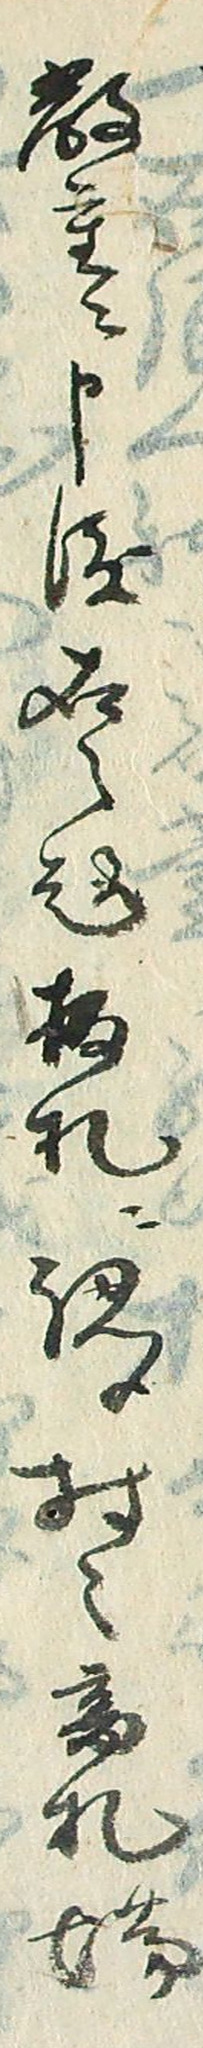厳重に申渡右之趣板札に認め村々高札場

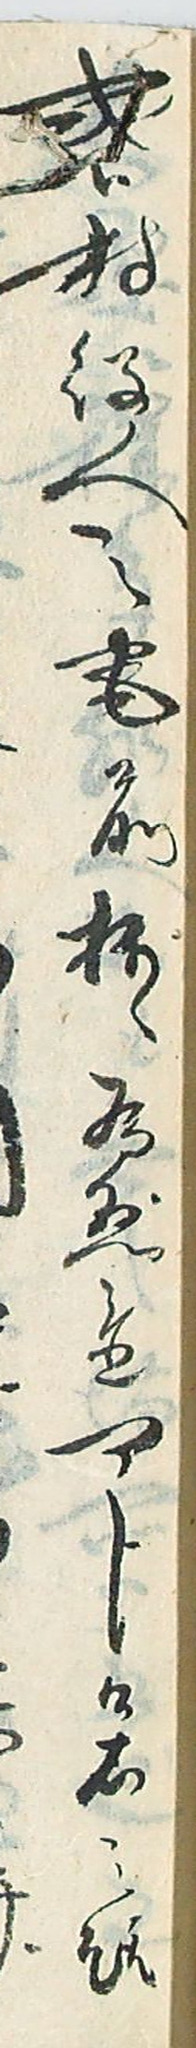或は役人之宅前抔へ為懸置可申候右之趣
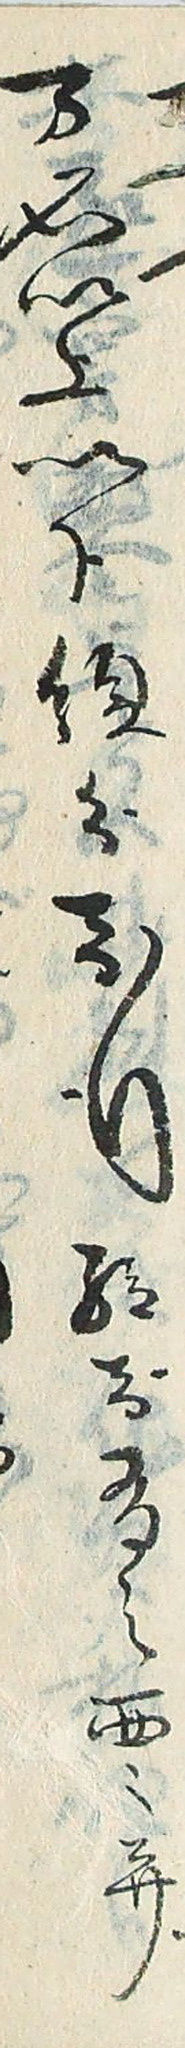万石以上以下領分知行給知有之面々幷
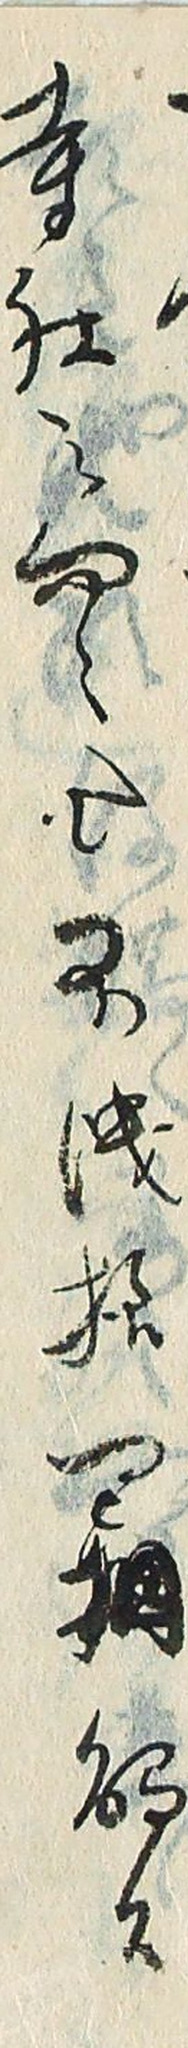寺社之向々へも不洩様可相触候
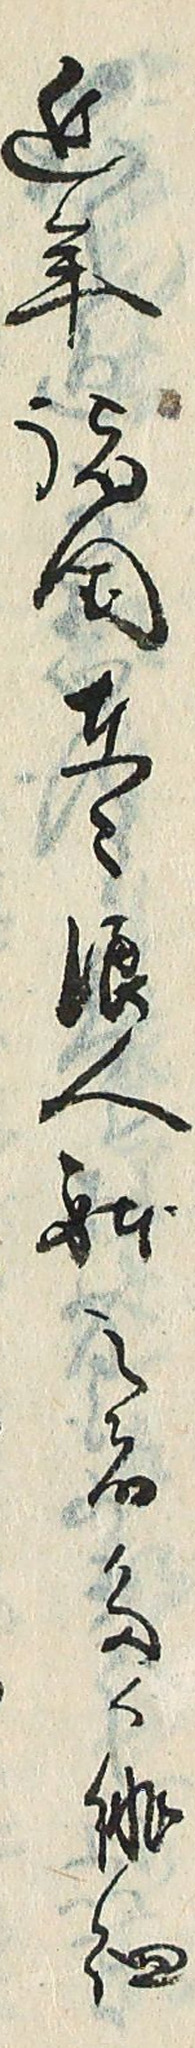近年諸国在々浪人体之者多く徘徊
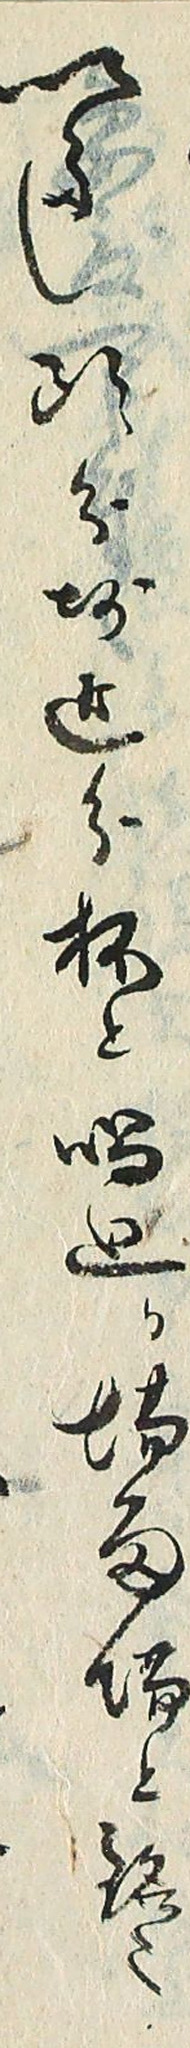いたし頭分師匠分抔と唱廻り場留場と銘々
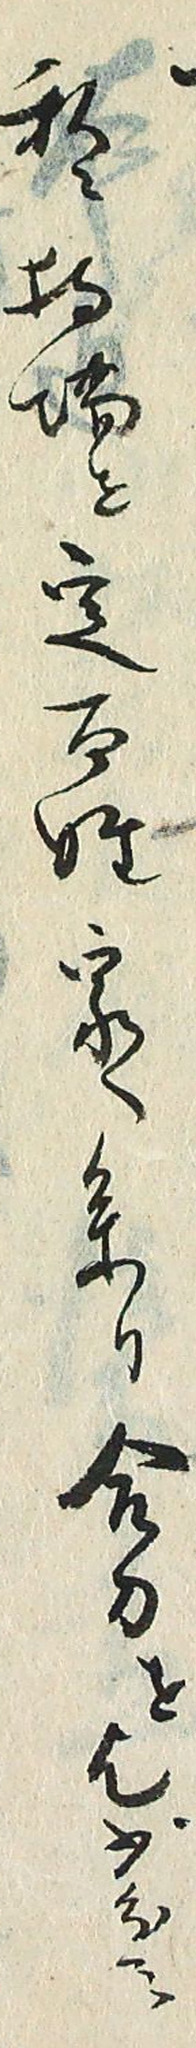私に持場を定百姓家へ参り合力を乞少分之
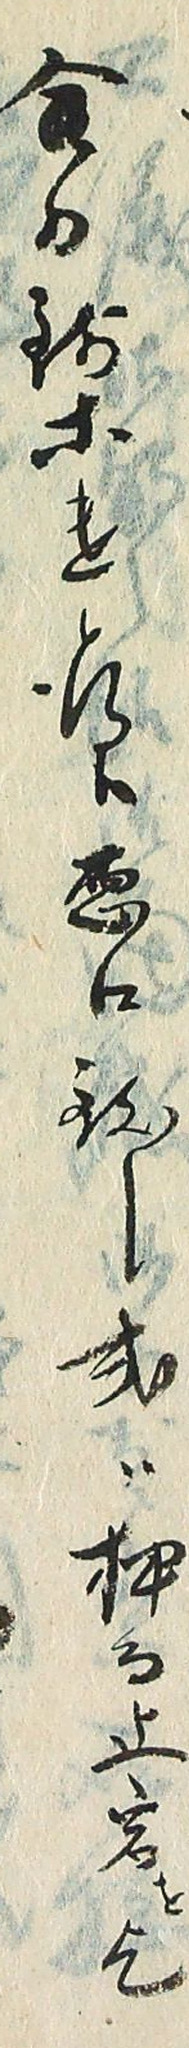合力銭等遣候得は悪口致し或は押而止宿を乞
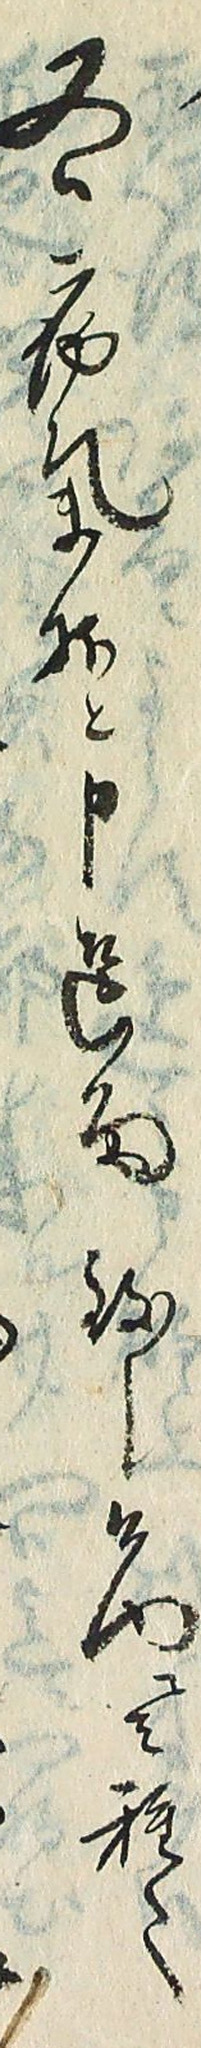又は病気抔と申逗留致し候内には種々
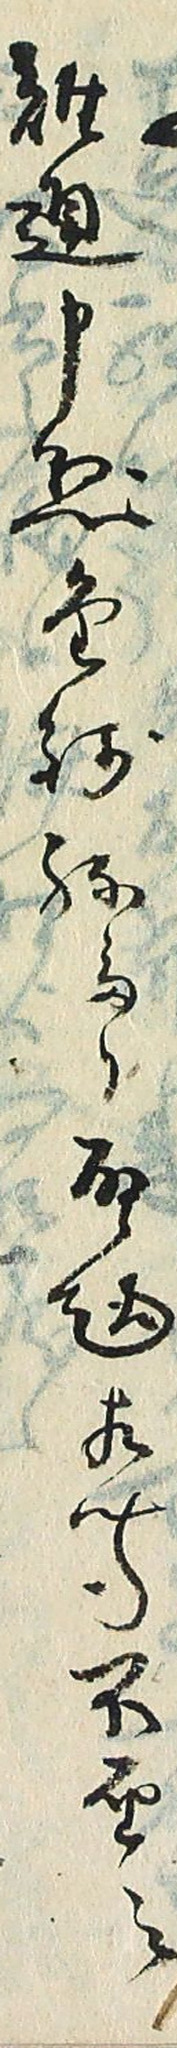難題申懸金銭ねたり取候趣相聞不届之
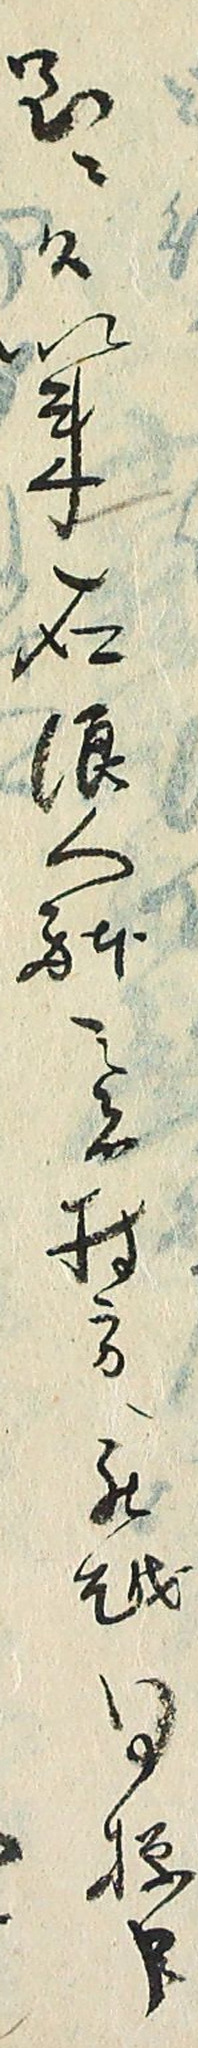至に候以来右浪人体之者村方へ罷越同様申
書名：諸御用御□受書控
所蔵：鳴門教育大学 Naruto University of Education
